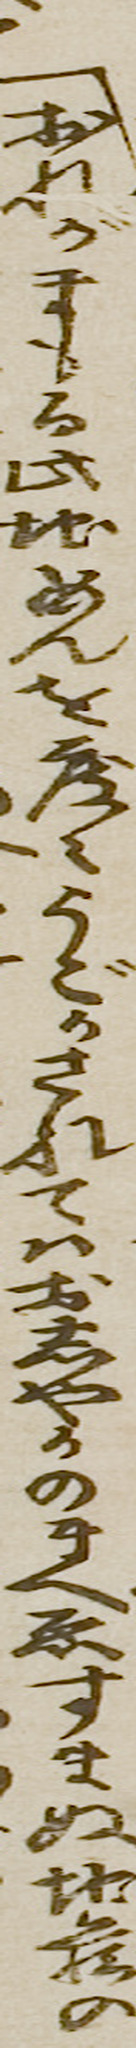地蔵「おれがまもる此地めんを度々うごかされてはおしやかのまへゑすまぬ地蔵の
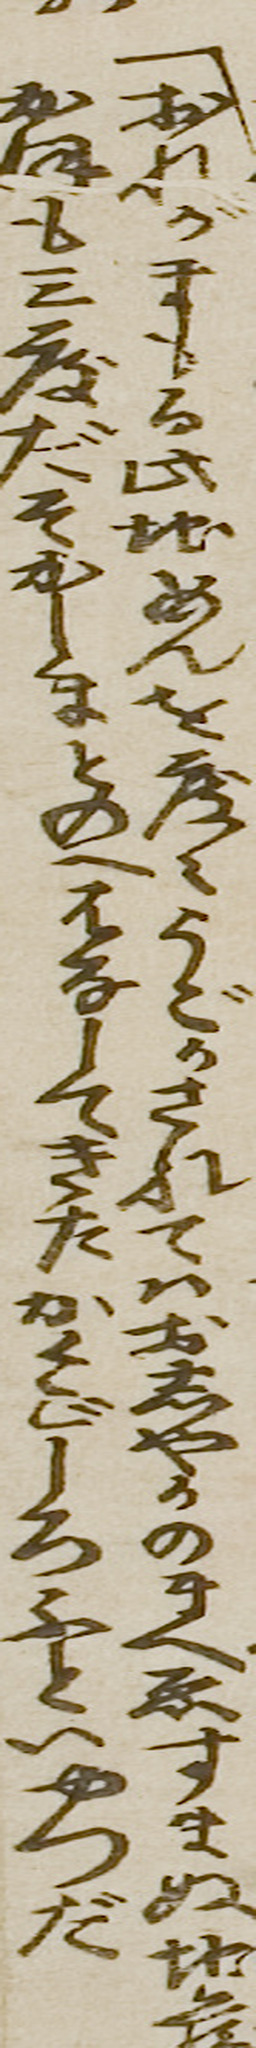かほも三度だそかしまとのへはなしてきたかくごしろふといやつだ
